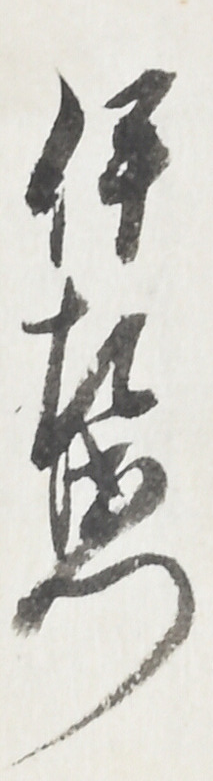伊左衛門

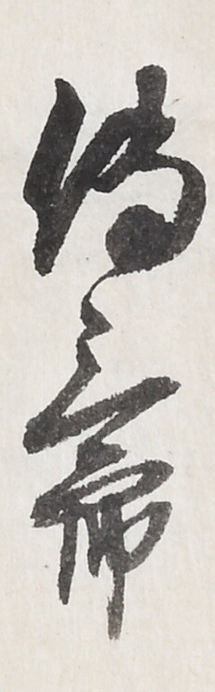庄三郎
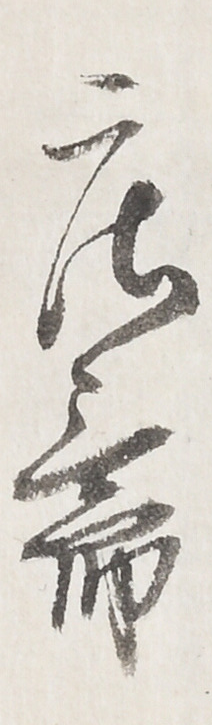庄三郎
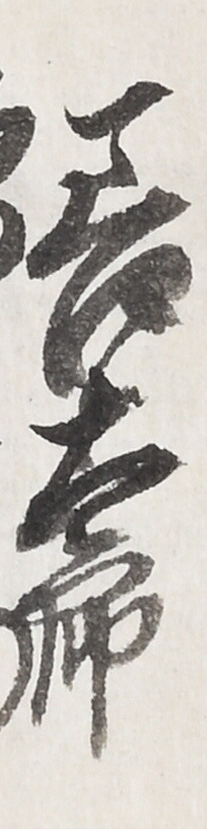善太郎
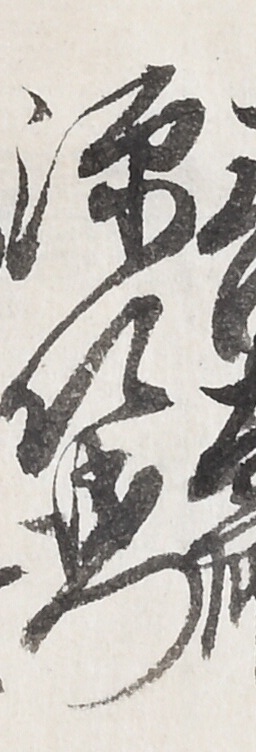伝左衛門
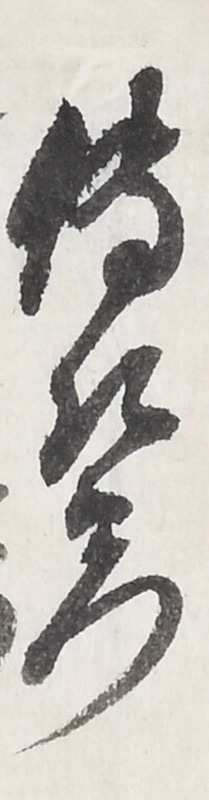伝左衛門
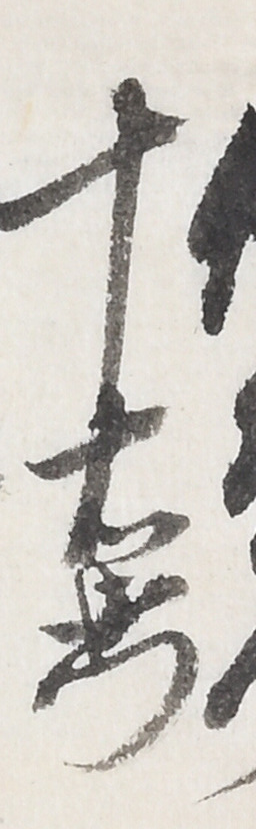久右衛門
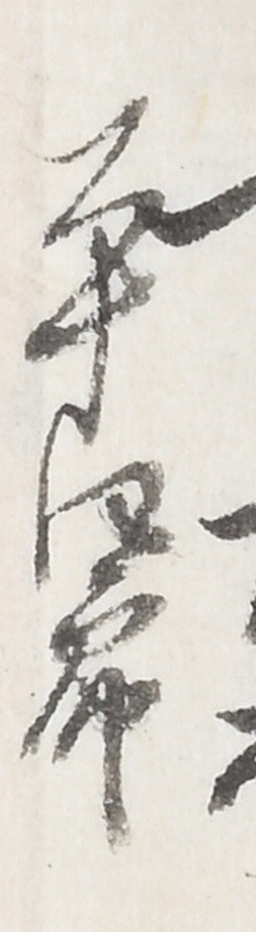平四郎
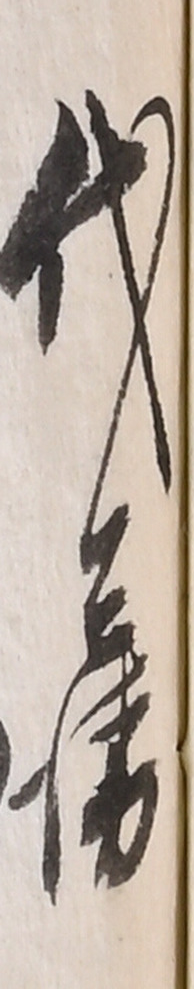代兵衛
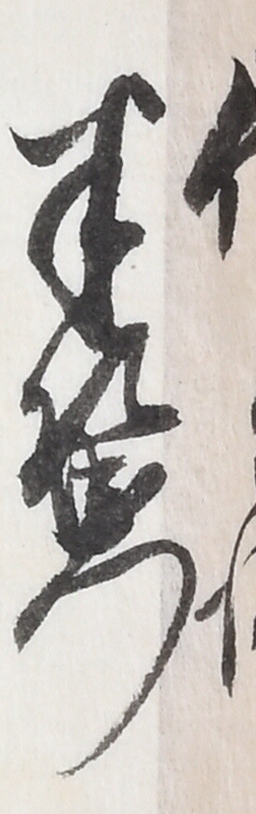伝左衛門
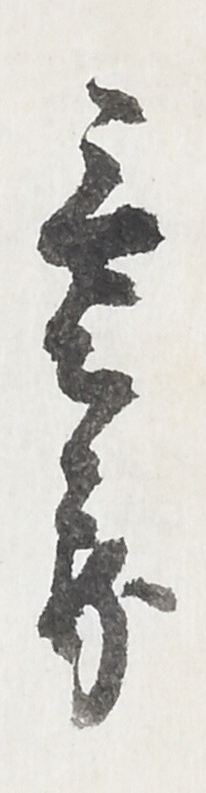代兵衛
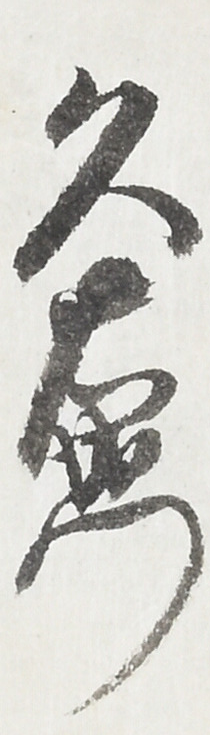久右衛門
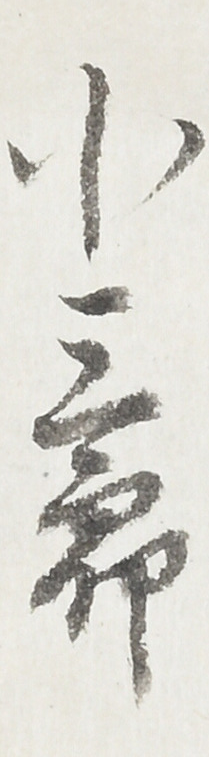小三郎

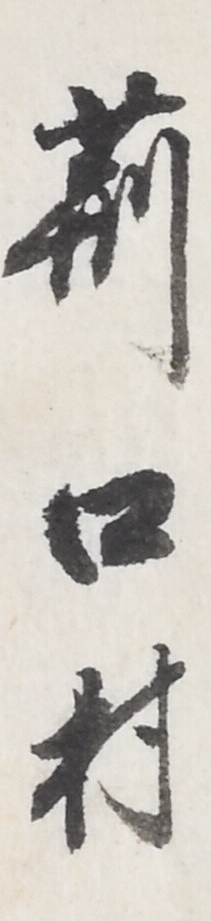荊口村
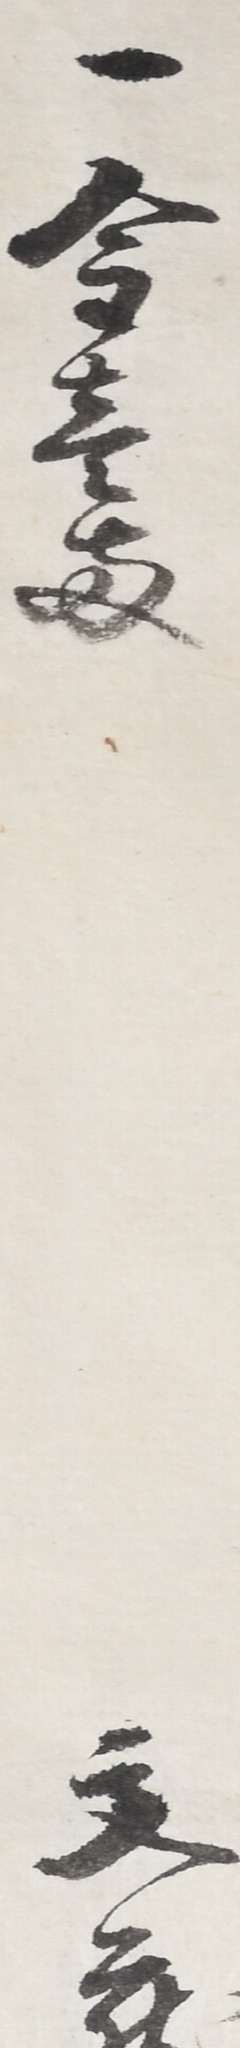一金壱両文蔵
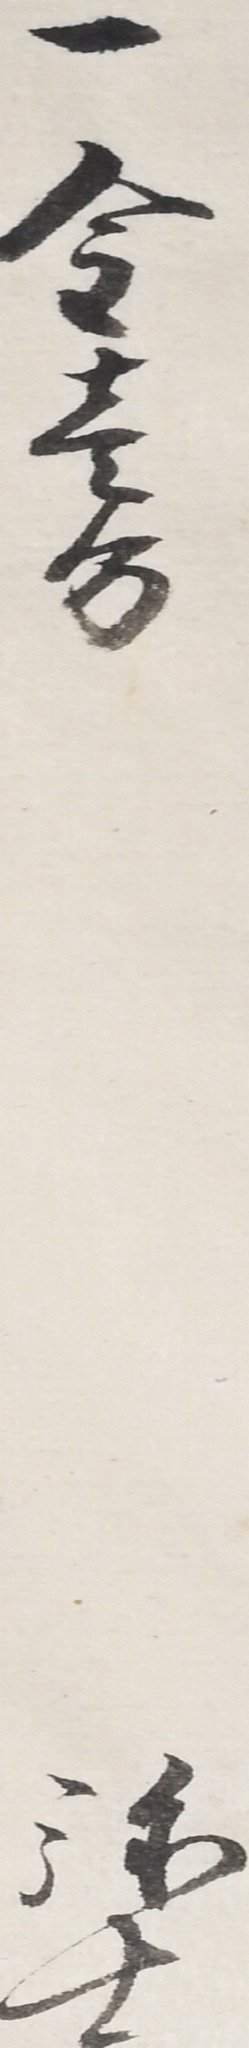一金壱分弥十郎
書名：御拝地百五拾年御祝儀献上御目録名前
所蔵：伊那市立高遠町図書館・合同会社AMANE
